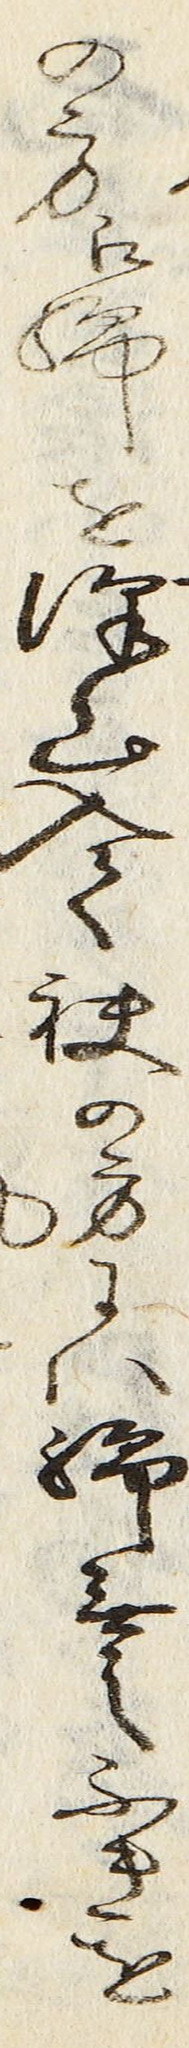の方え綿を沢山入て袂の方にハ綿無之ふきを
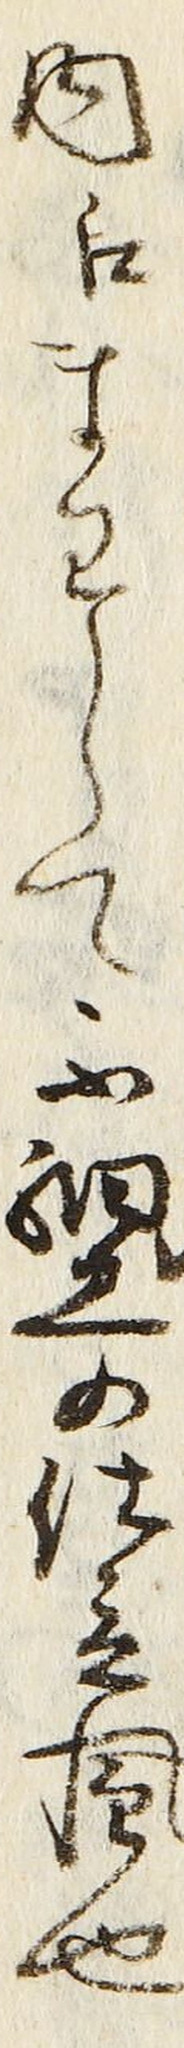内えまわして不細工の仕立風也
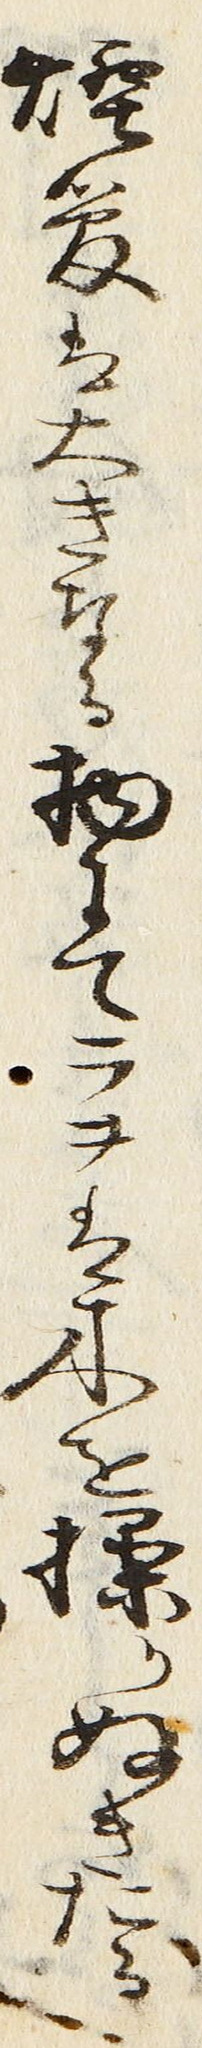煙管は大きなる物にてラヲは木を操りぬきたる
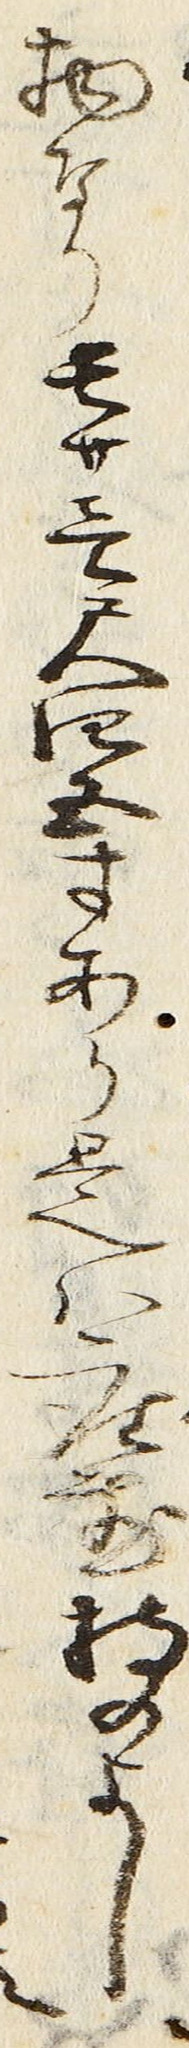物なり長サ壱尺四五寸あり是ハ座敷持のよし
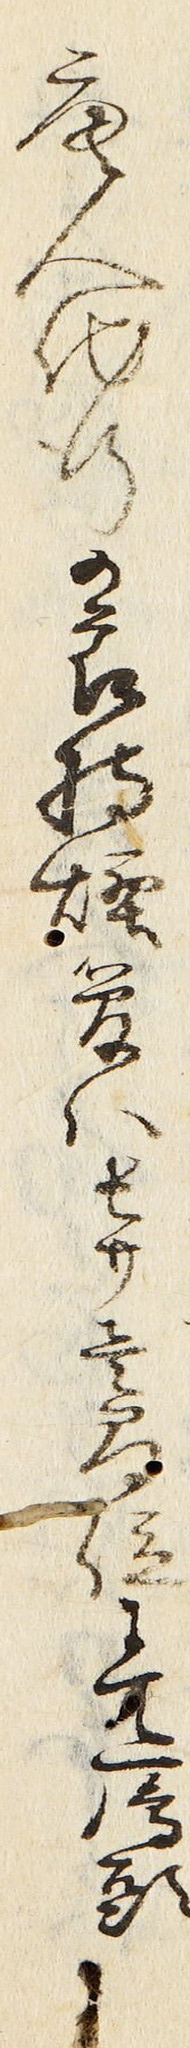唐人他行の節持煙管ハ長サ壱尺位にて鳫頸
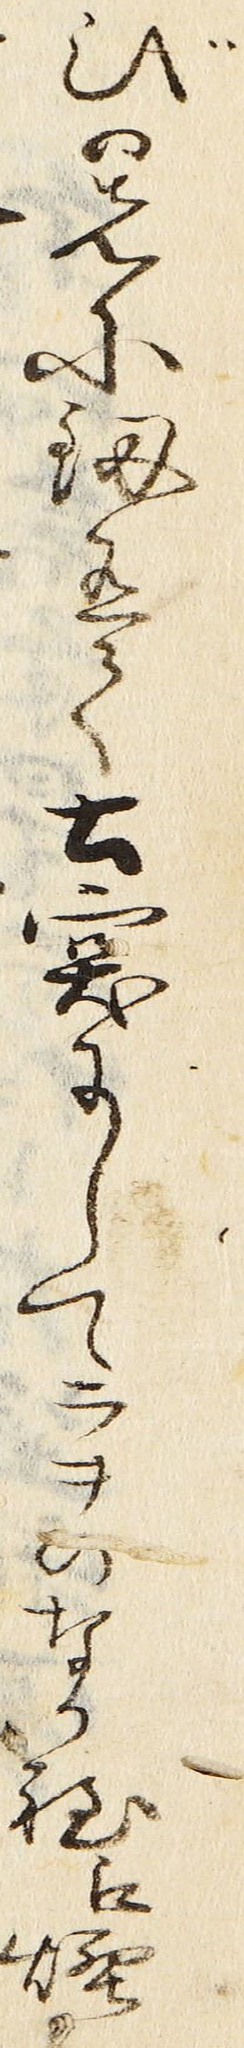びの先に釼有之土突にしてラヲのなか程え煙
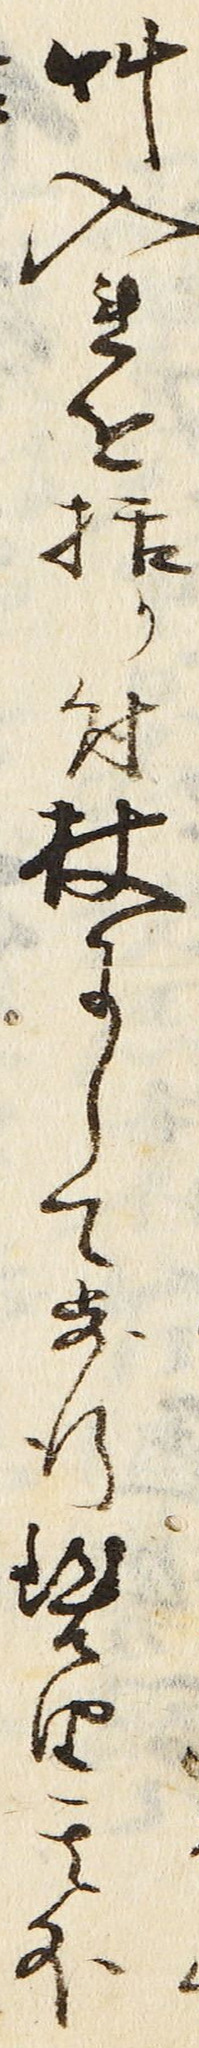艸入れを括り付杖にして歩行致候由其外
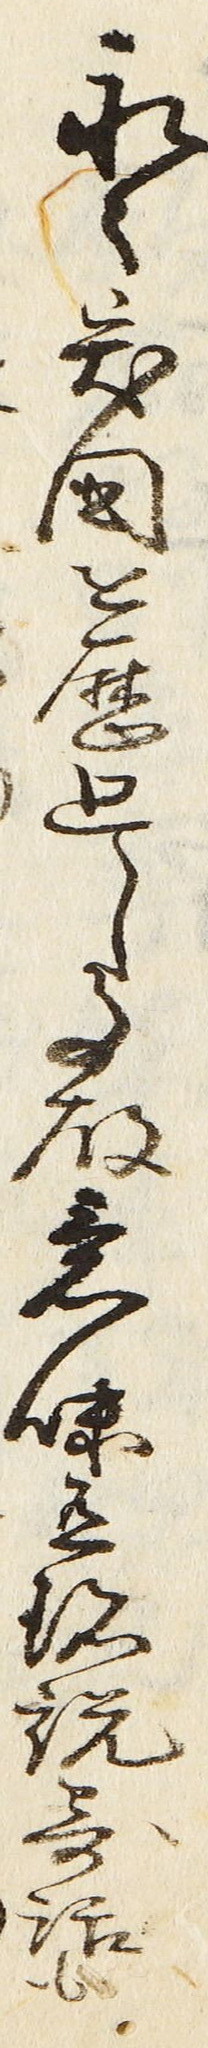永々異国を歴廻したる故意味有珍説奇話も
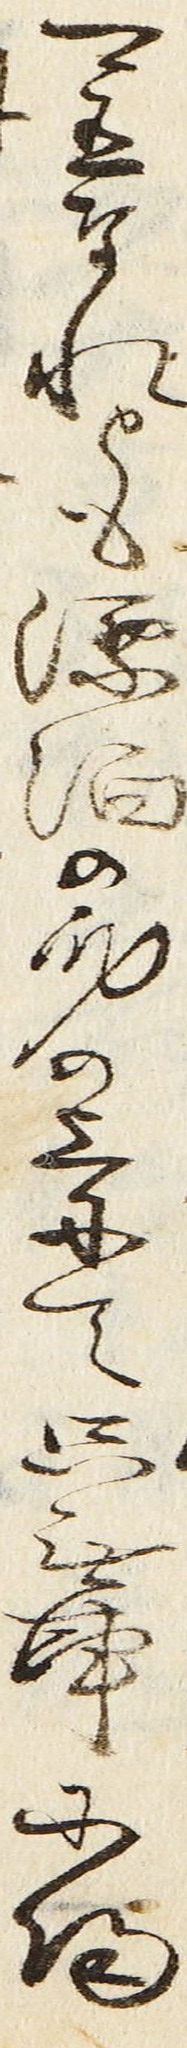可有なれとも漂泊の身の上にて只無事に帰
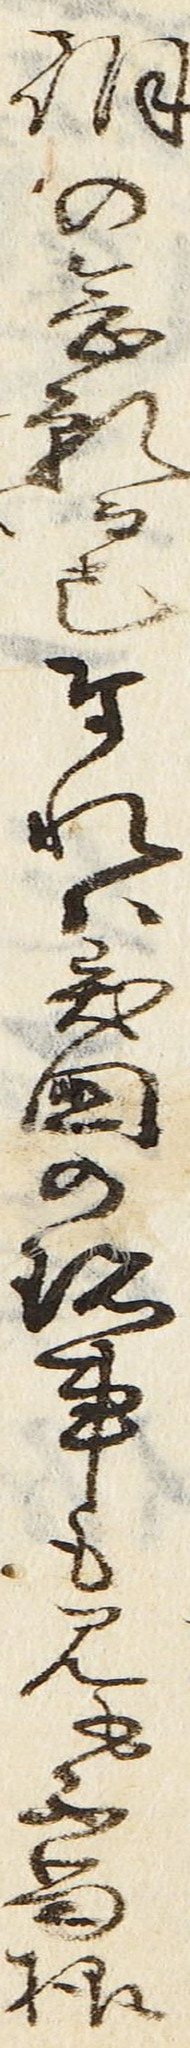朝の念願而已なれハ異国の珍事も見も不留様
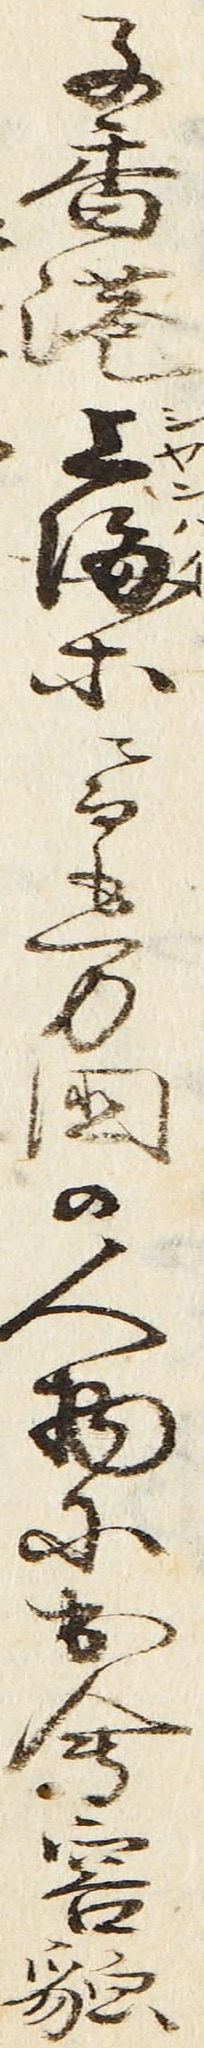子香港上海等ニ而も万国の人物に出会容貌
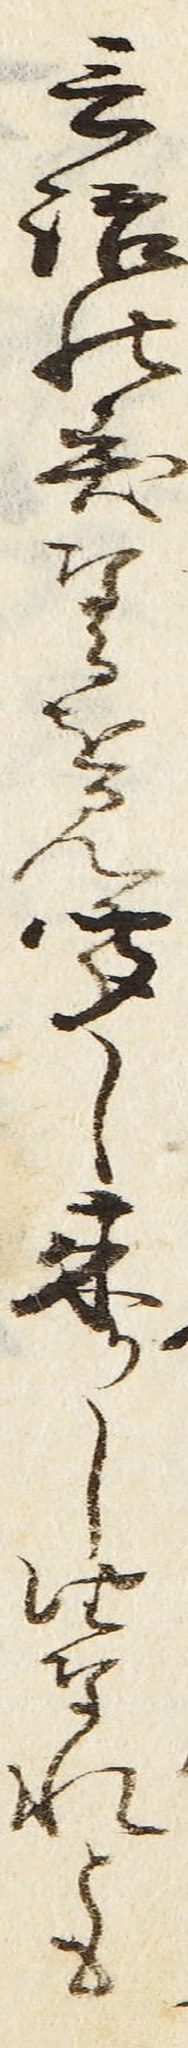言語の異なるを見聞し来りし由なれとも
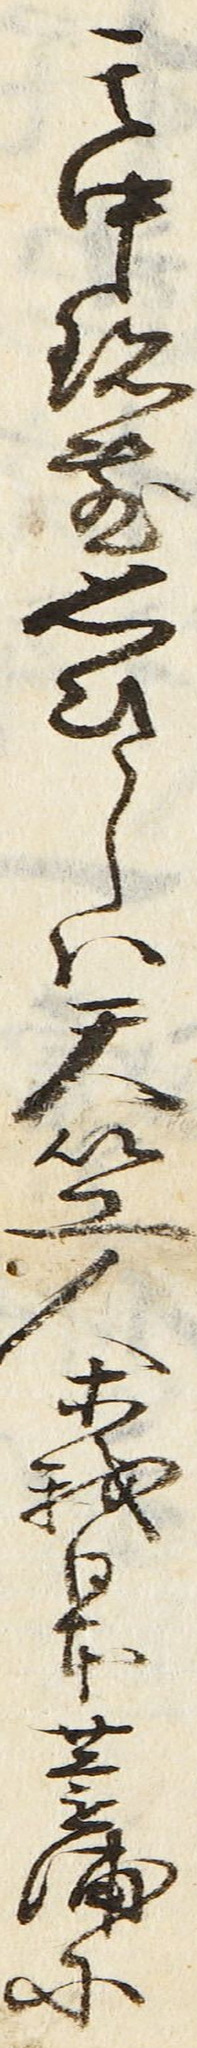其中珍敷思ひしハ天竺人等我日本薗浦に
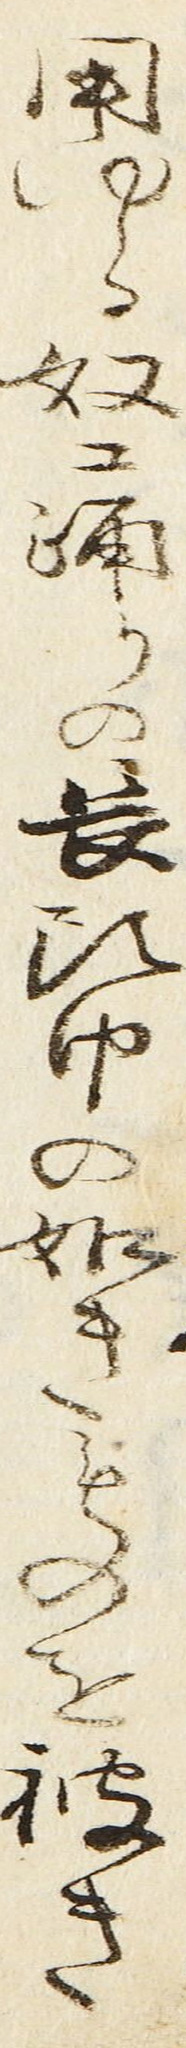用ゆる奴コ踊りの長頭巾の如きのもを被き
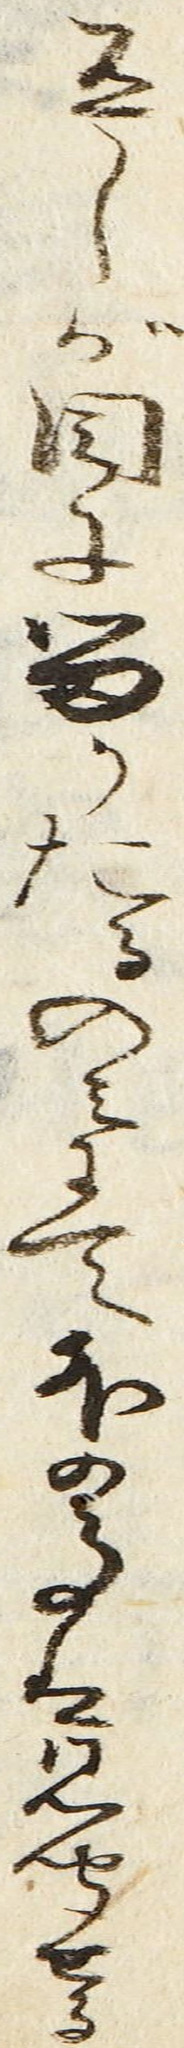有しが目に留りたるのミにて外の事は見聞せる
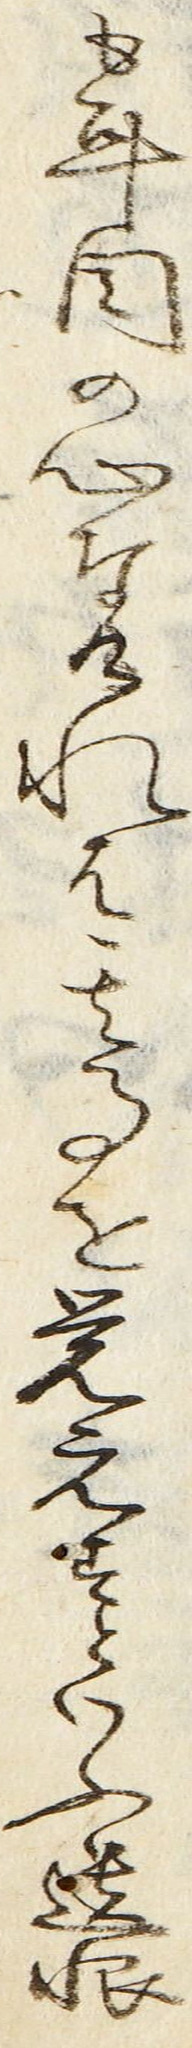も耳目の心なけれは其事を覚えすといふ遺恨
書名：亜墨利加漂流記聞
